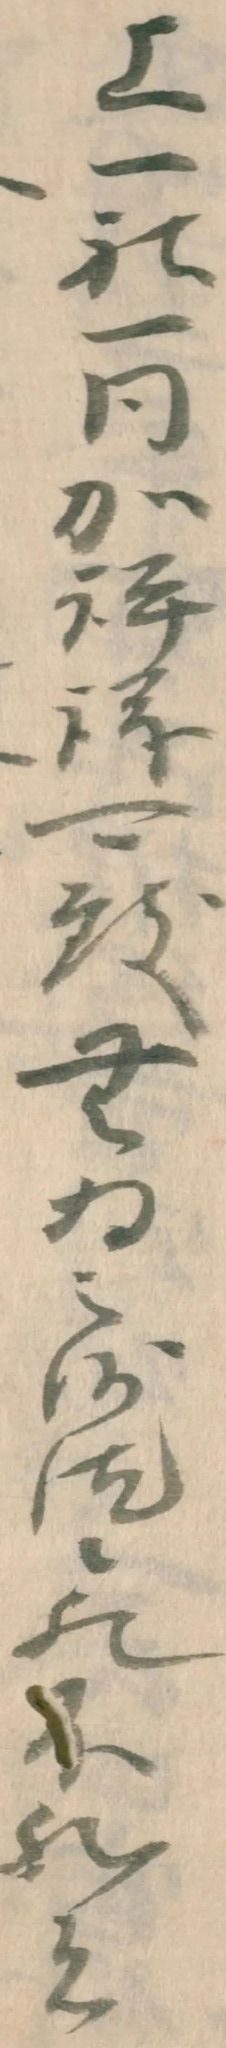上一社一同加評議可致無為之沙汰候歟不然は
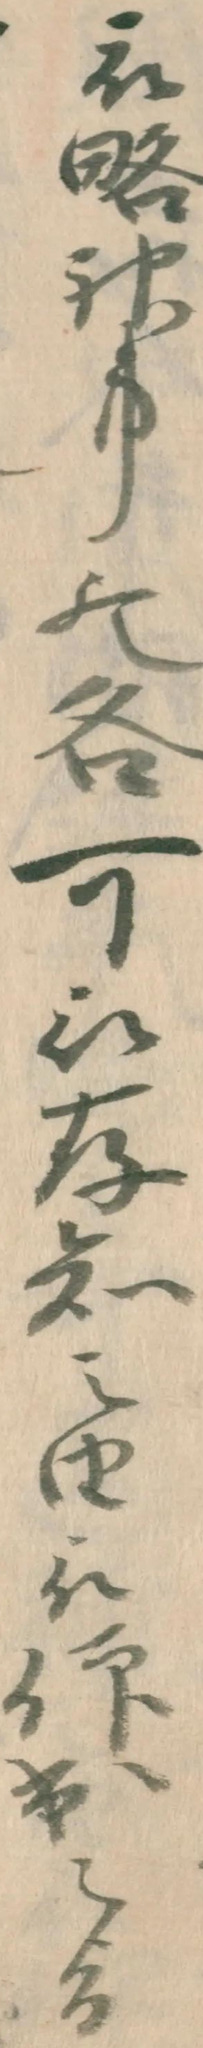被略神事歟各可被存知之由被仰出之旨
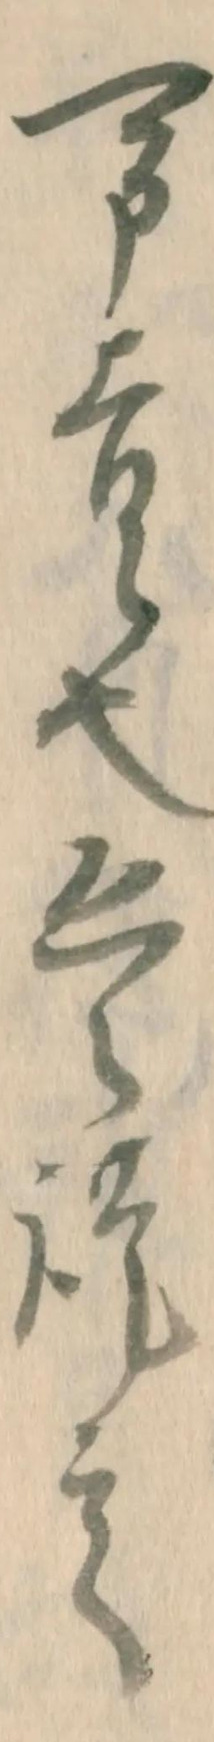可申旨候也恐々謹言
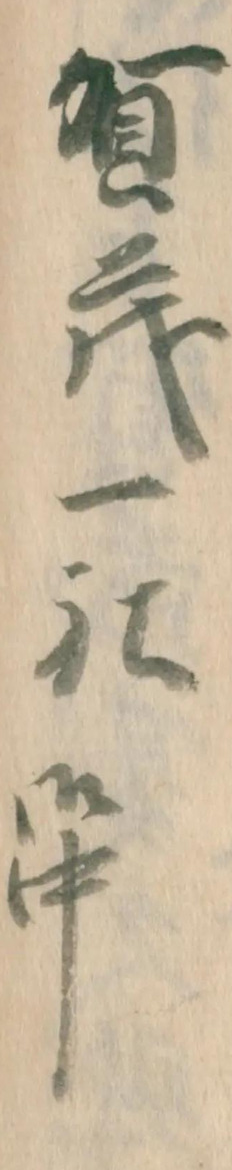賀茂一社御中

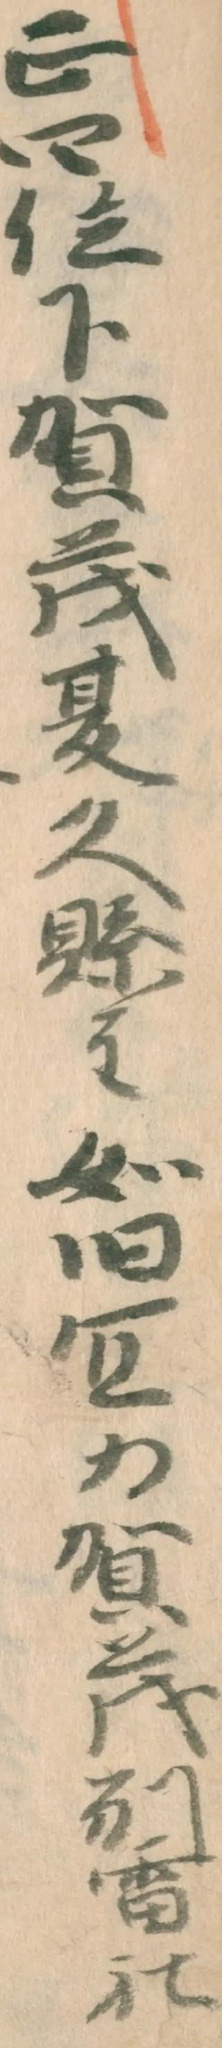正四位下賀茂夏久県主如旧宜為賀茂別雷社
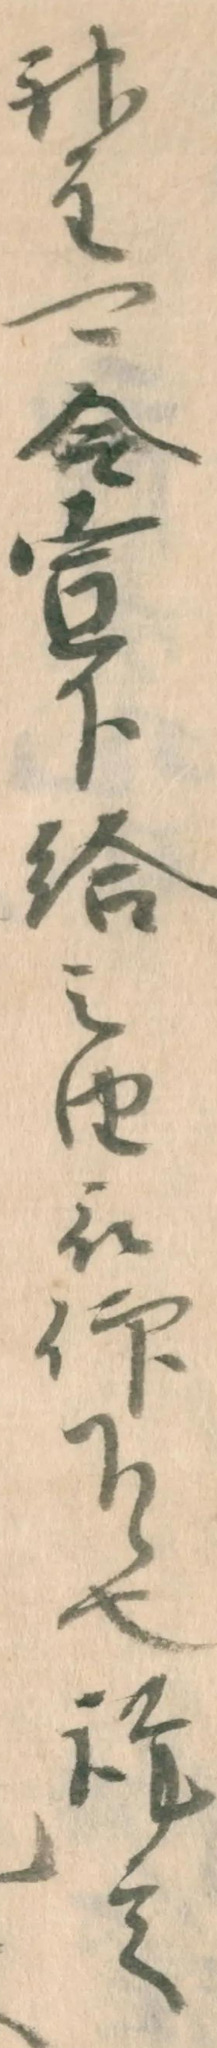神主可令宣下給之由被仰下候也謹言
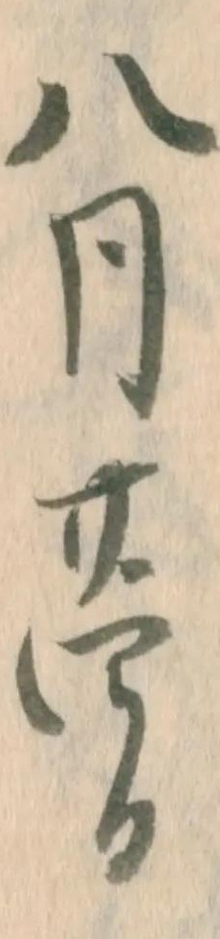十月廿四日
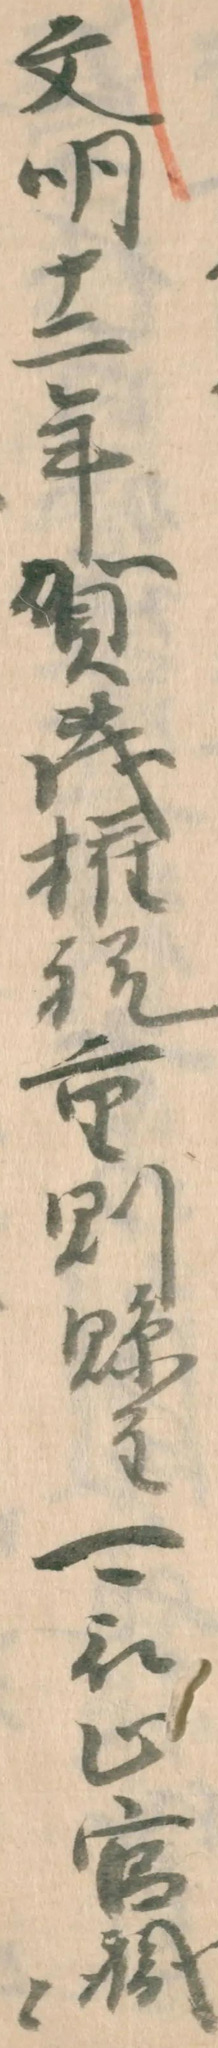文明十二年賀茂権祝重則県主可被止官職候
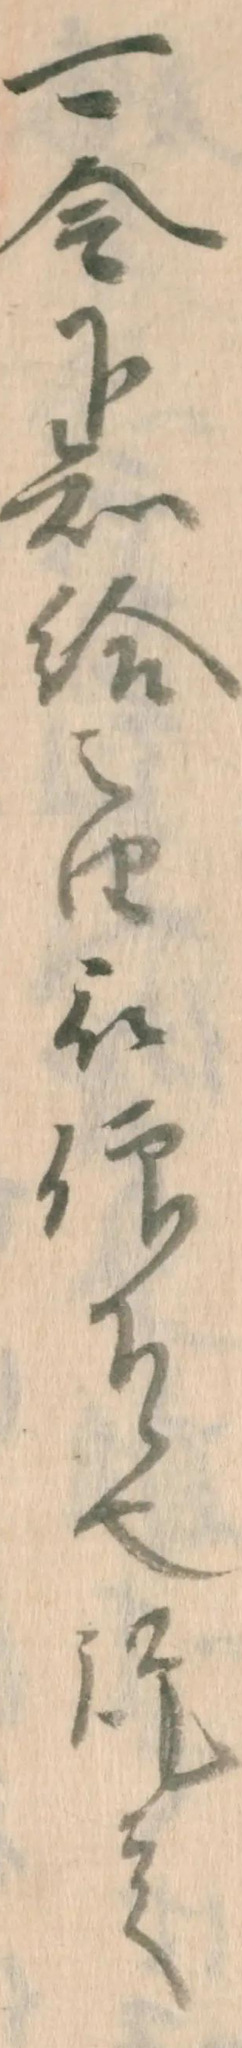可令下知給之由被仰下候也謹言
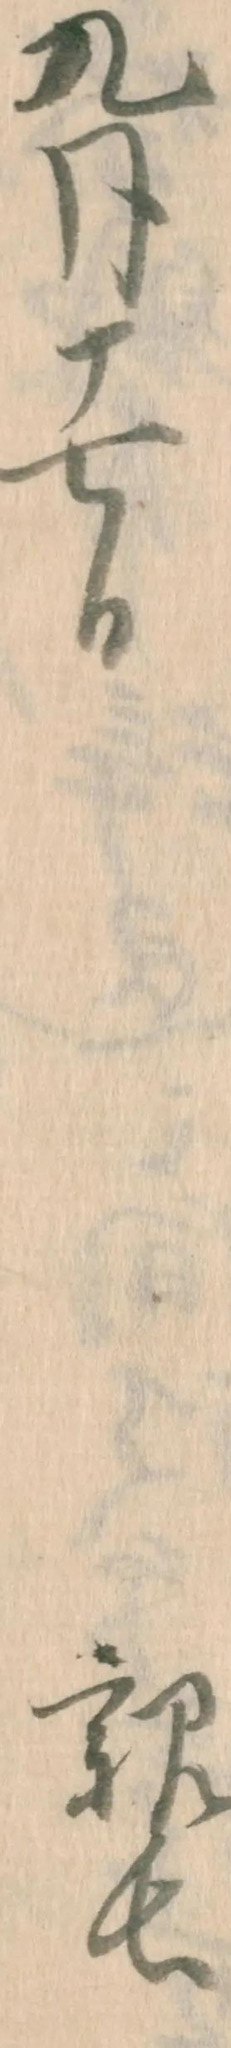九月十七日親長
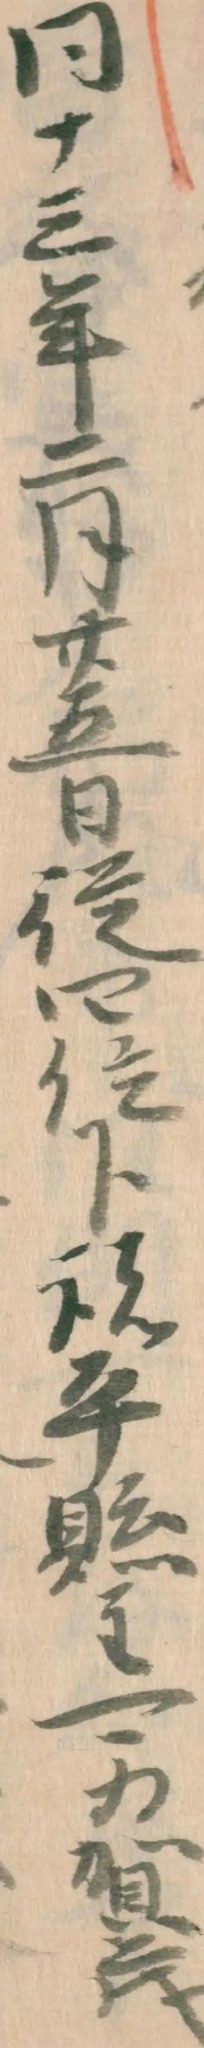同十三年二月廿五日従四位下諸平県主可為賀茂
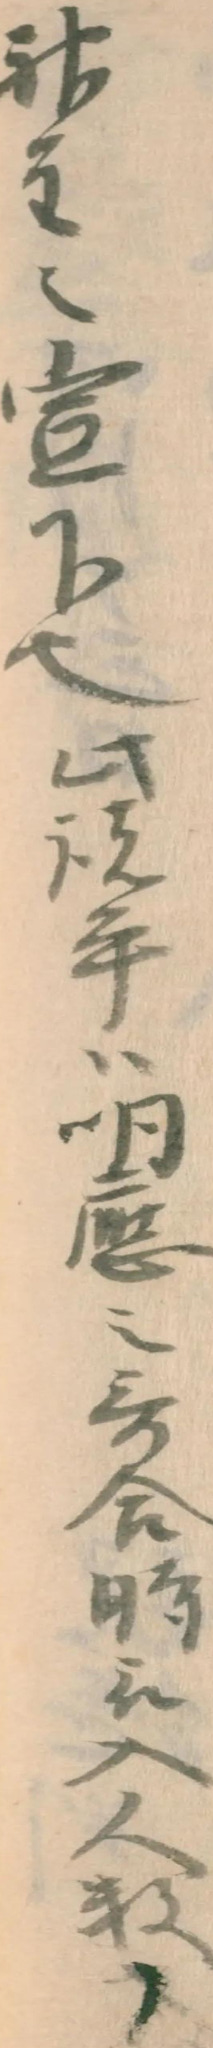神主之宣下也此諸平は明応之哥合時被入人数也
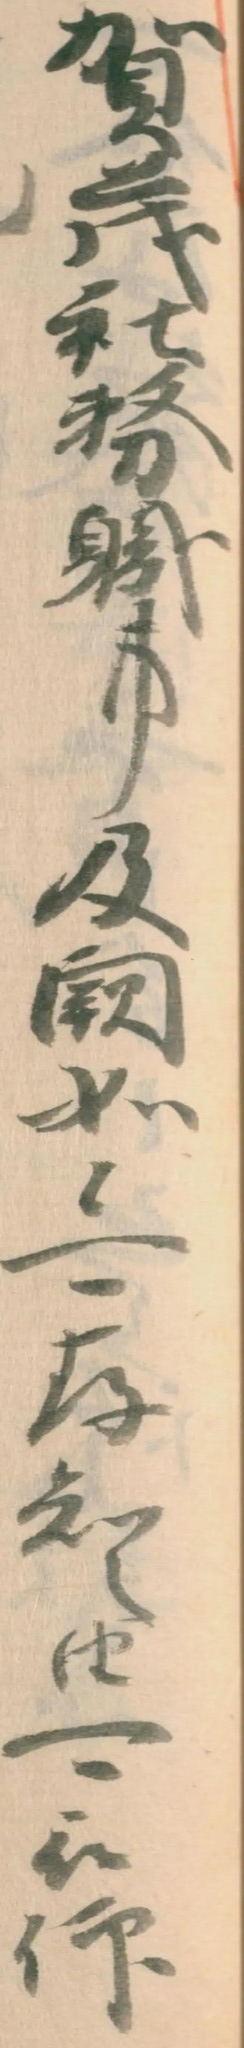賀茂社務職事及闕如候可存知之由可被仰
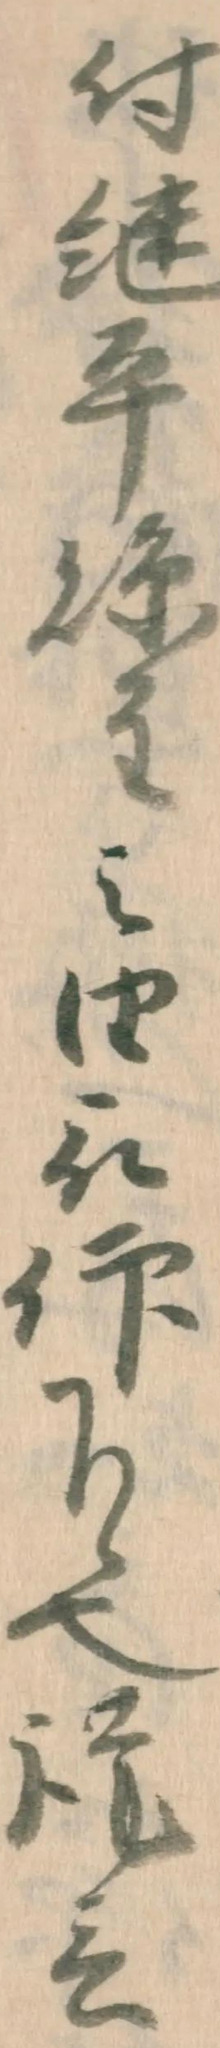付継平県主之由被仰下候也謹言
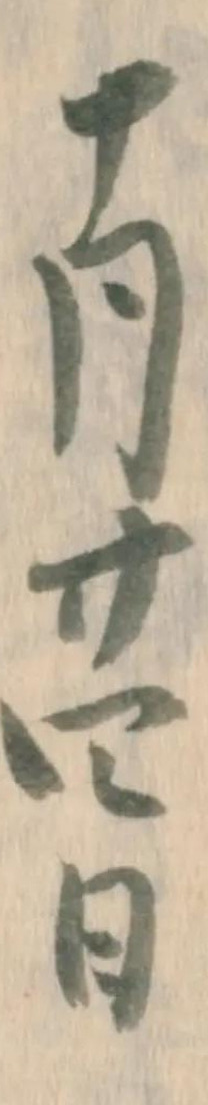十月廿四日
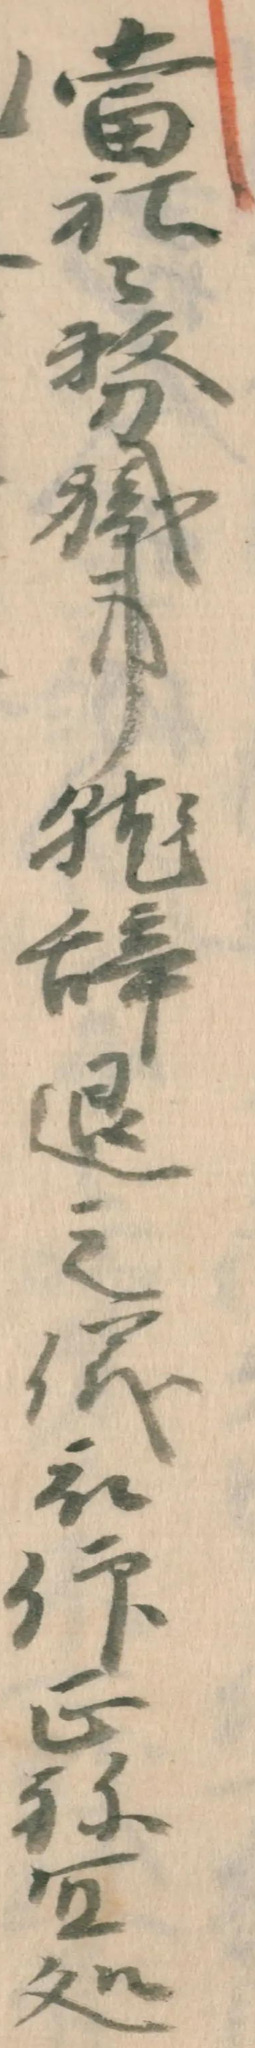当社々務職事就辞退之儀被仰正弥宜処
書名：賀茂社記録. 第1冊
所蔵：国立国会図書館 National Diet Library, JAPAN
